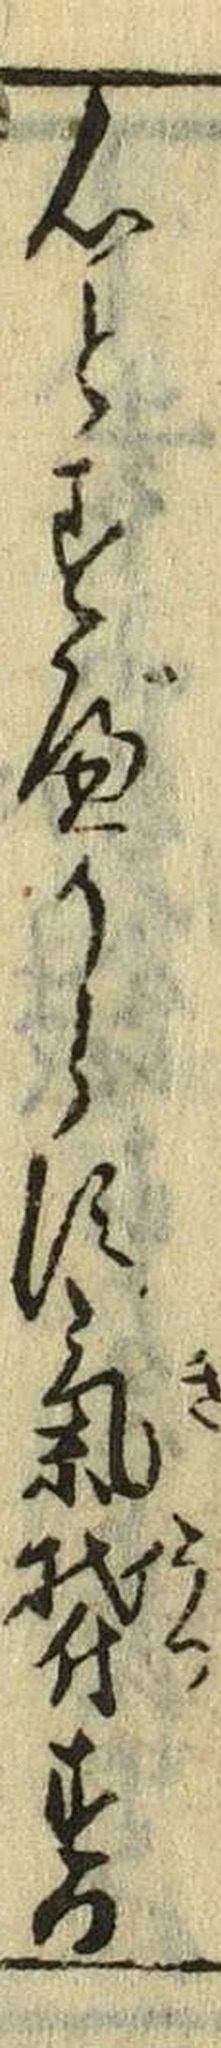心とすべからす気鬱する
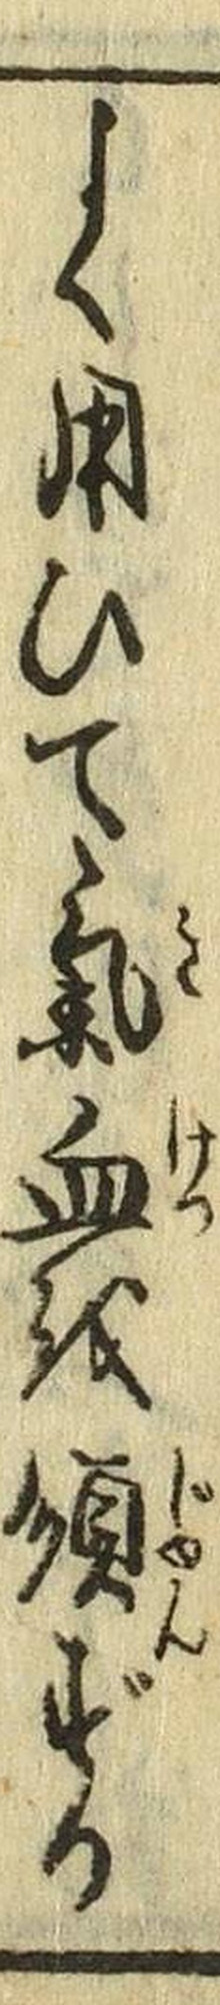よく用ひて気血を順ずる
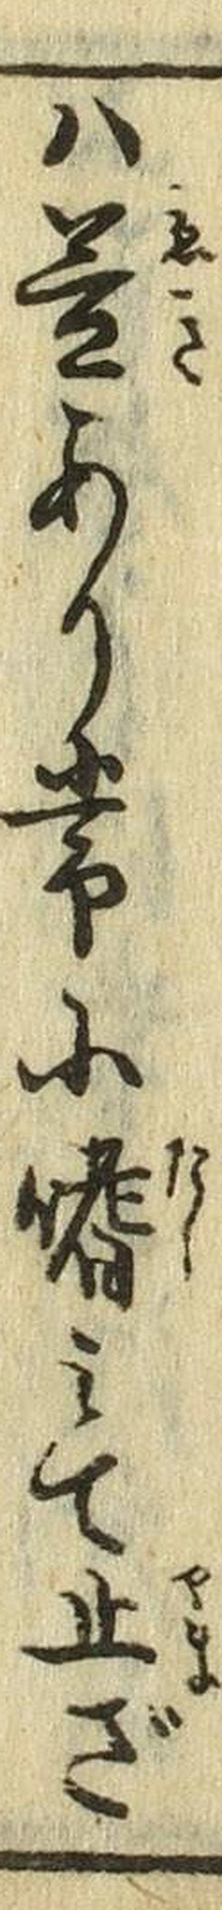は益あり常に嗜みて止ざ
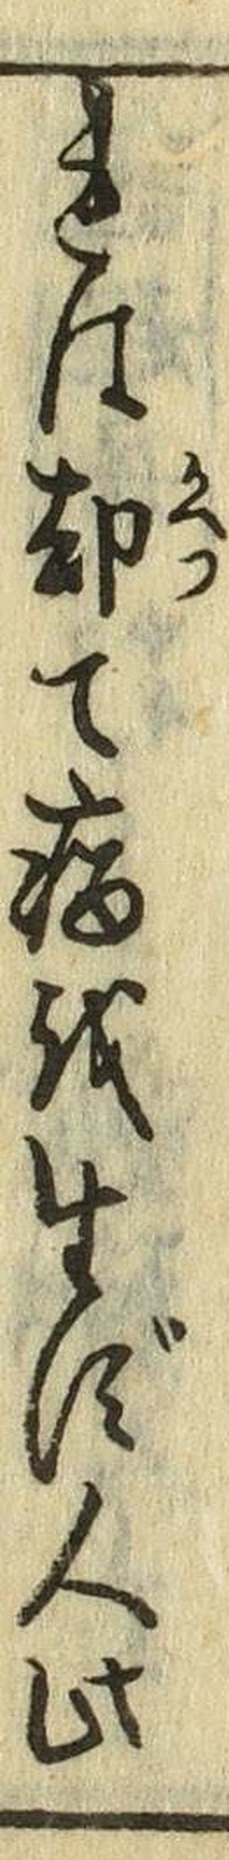れは却て病を生ず人此
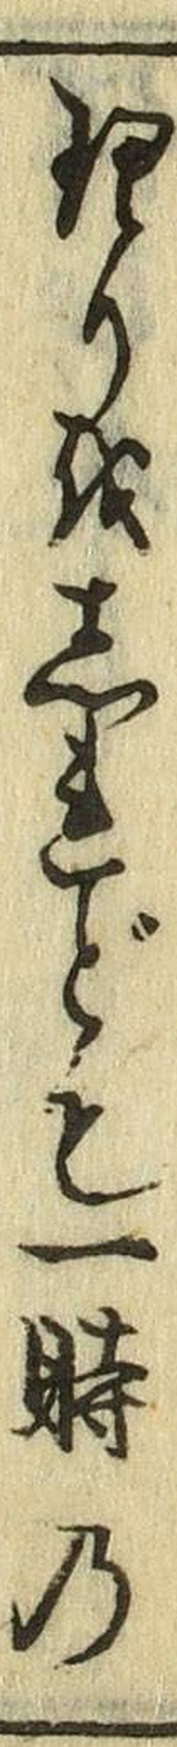理りをしれども一時の
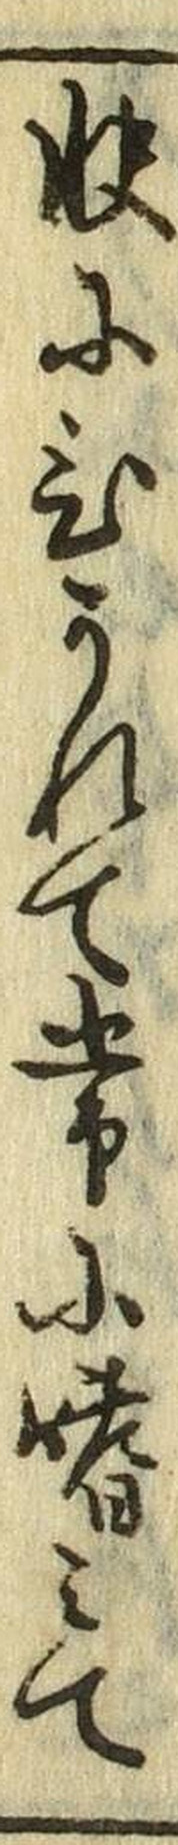快にひかれて常に嗜みて
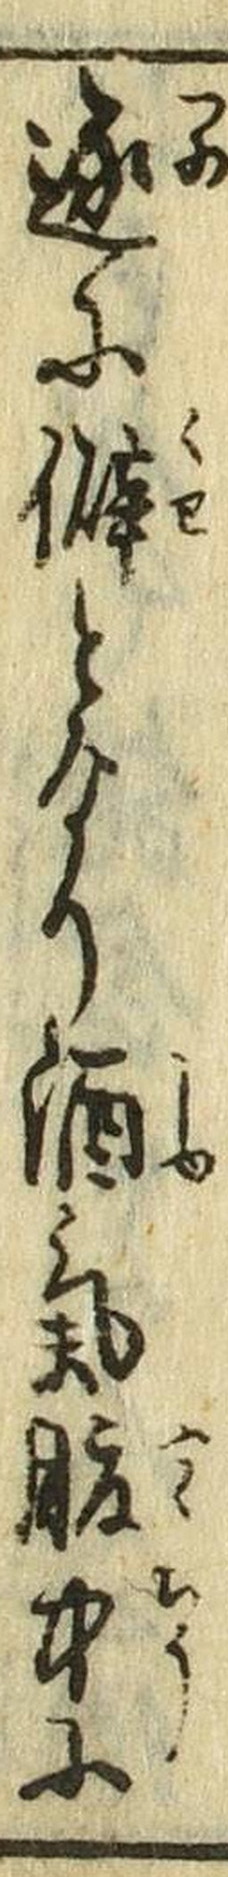遂に僻となり酒気腹中に
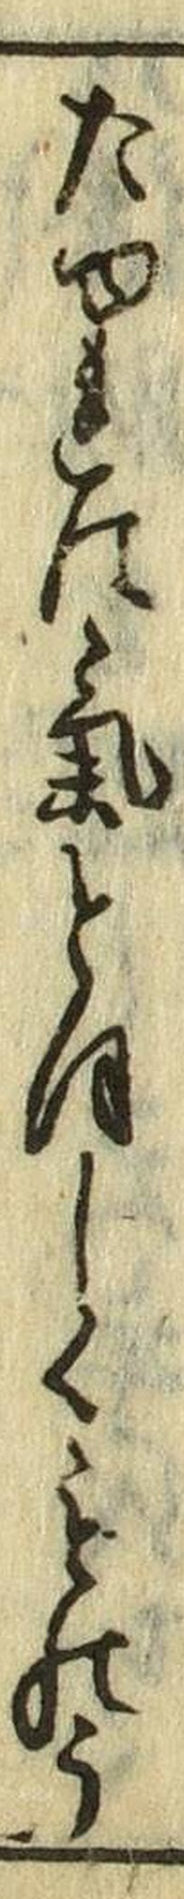たゆれは気とほしくものう
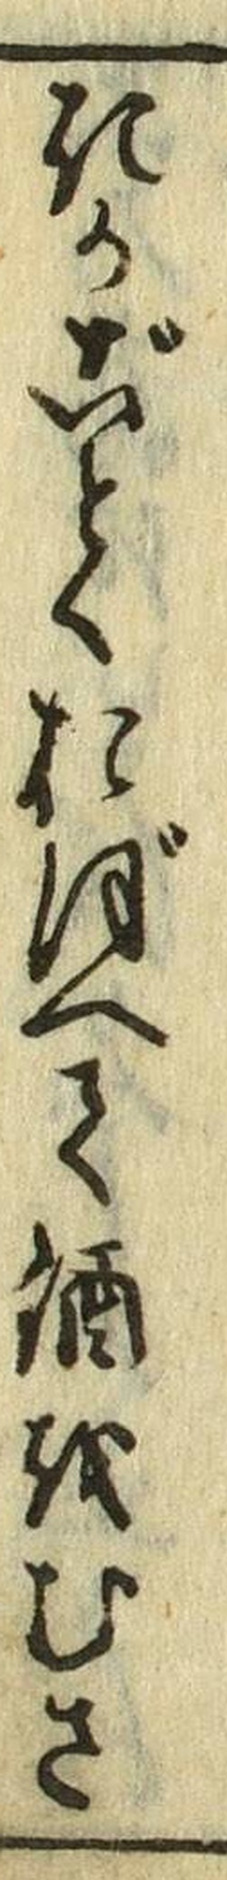きかごとくおぼへて酒をむさ
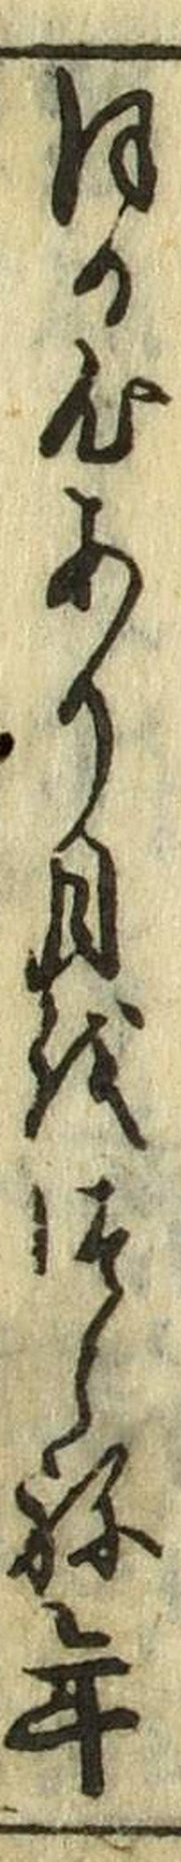ほる心あり月をつらね年
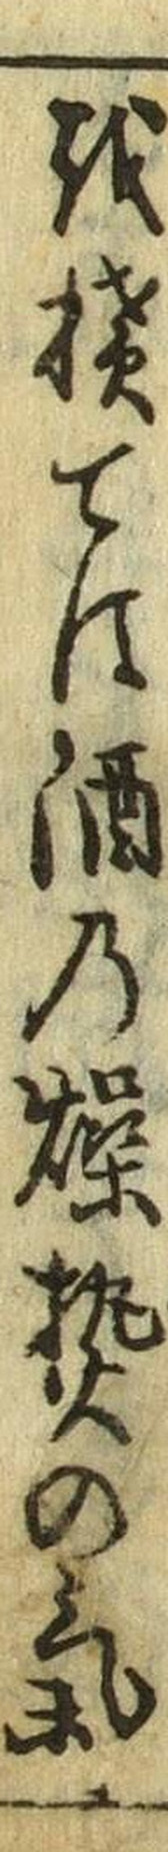を積ては酒の燥熱の気

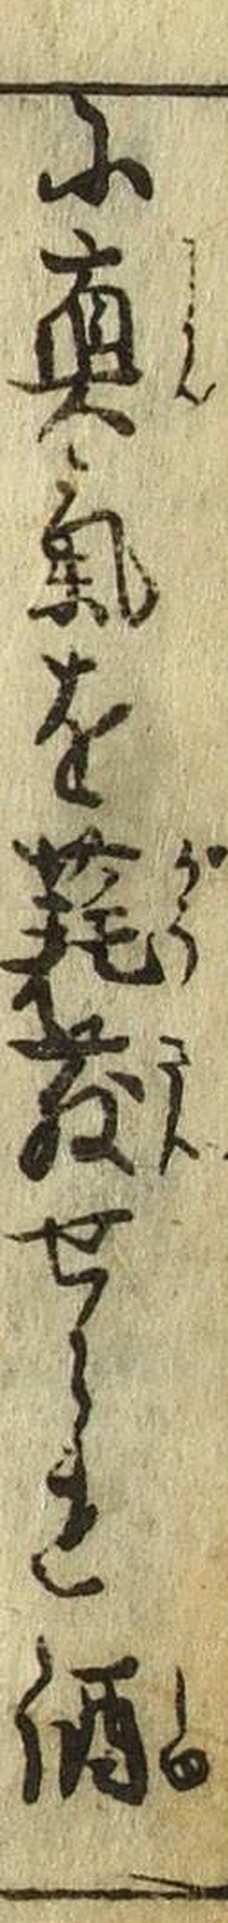に真気を耗散せられ酒
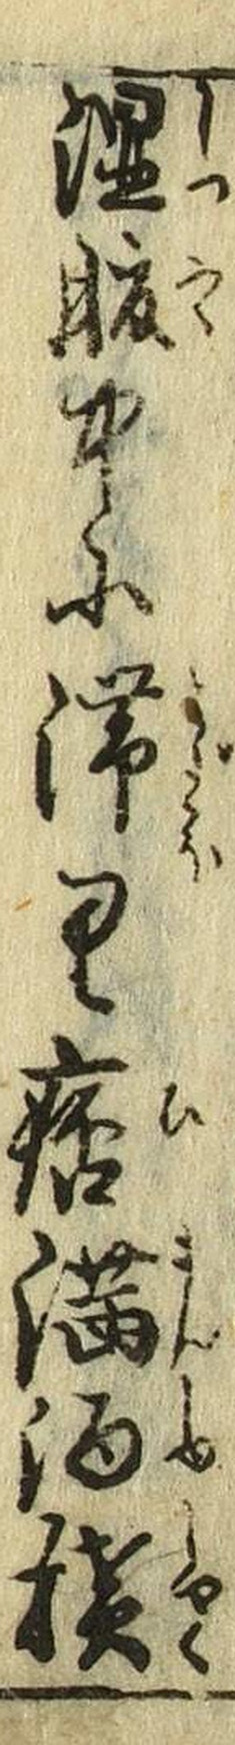湿腹中に滞り痞満酒積
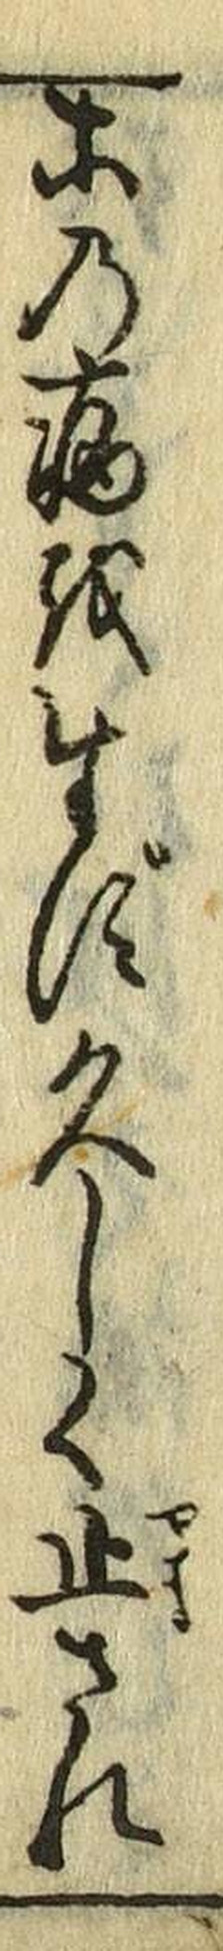等の病を生ず久しく止され
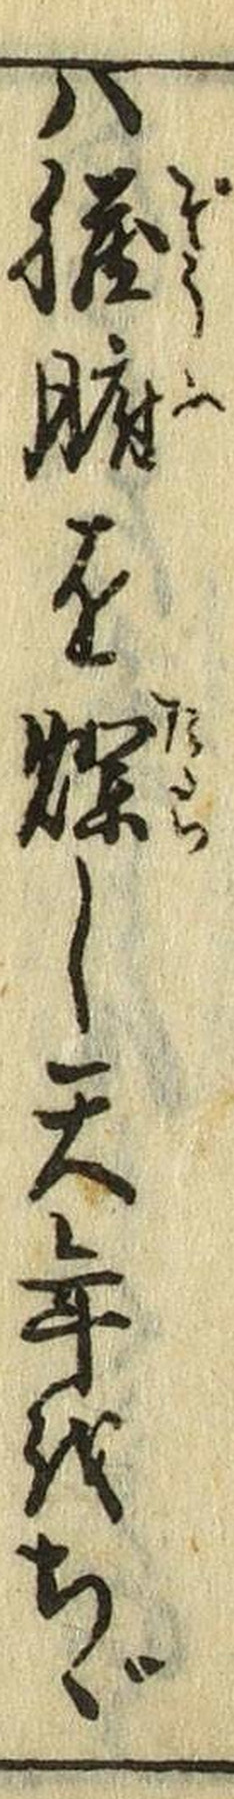は臓腑を爛し天年をちゞ
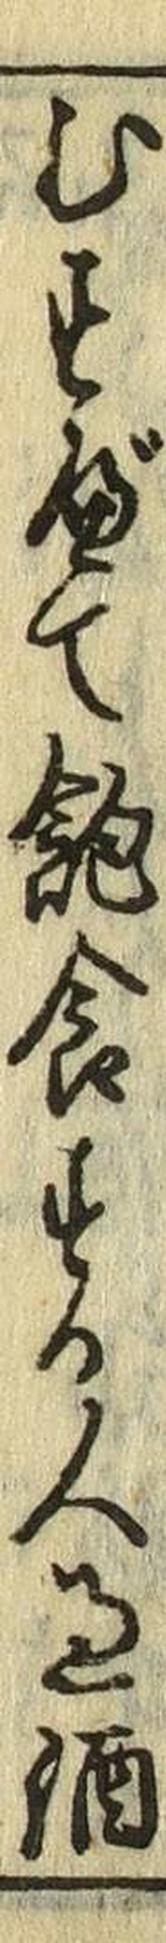むすべて飽食する人過酒
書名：居家養生記
